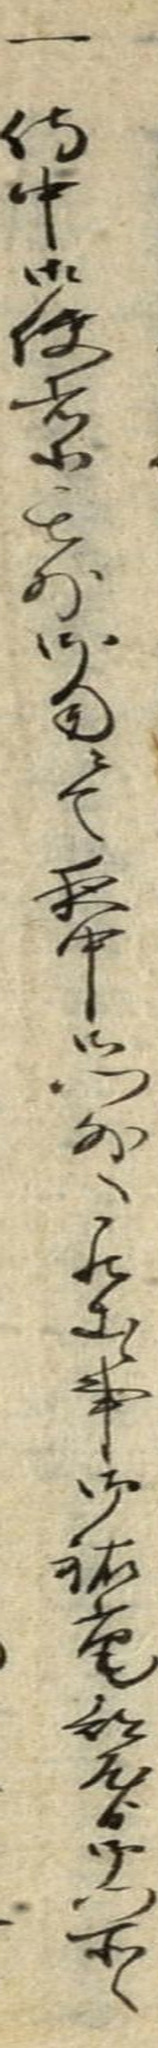一侍中御使者等其外御用にて夜中御門外へ罷出候事御祐筆部屋ゟ御門所へ
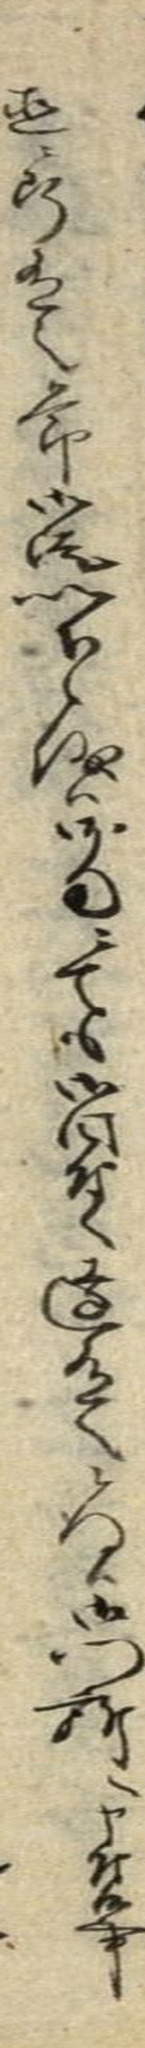直に断有之節御徒以下之儀は御用にても御目付へ達有之候得は御門所へ申付候事
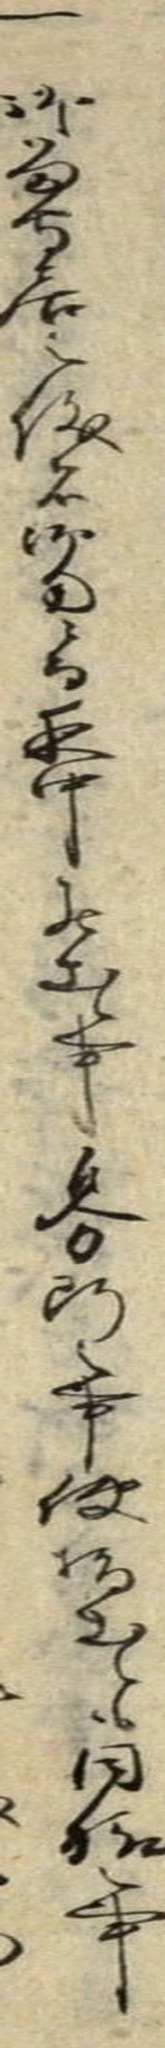一御留守居之儀は御用にて夜中御罷出候事自分断之事使指出候も同様之事
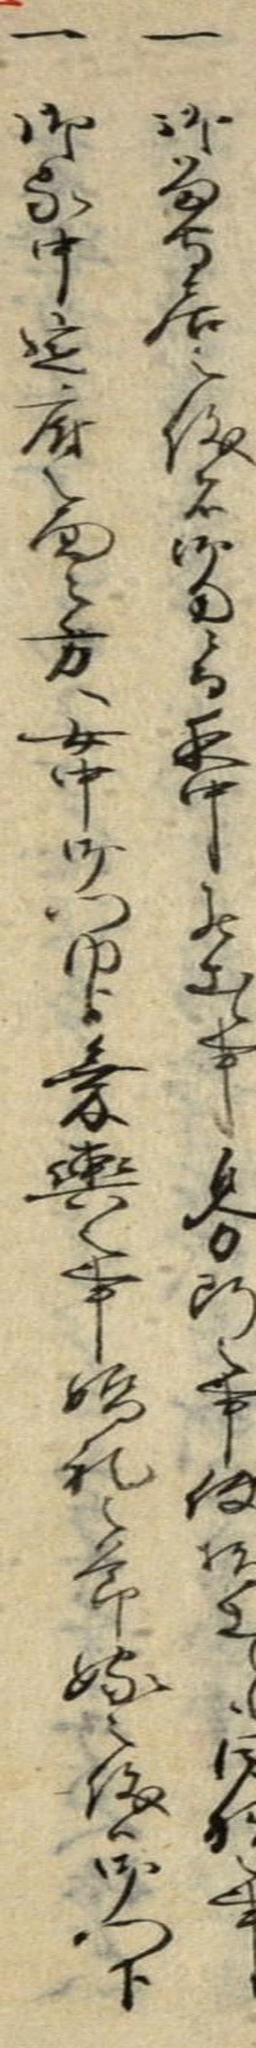一御家中定府之面々方へ女中御門内ゟ乗輿之事婚礼之節嫁之儀は御門下

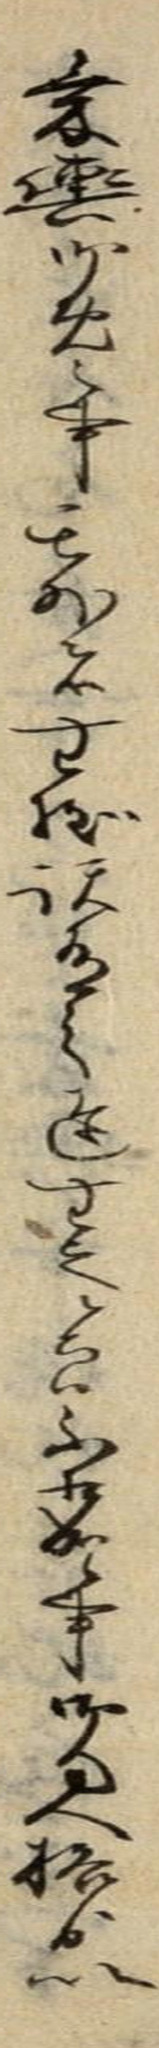乗輿御免之事其外は無據訳有之達無之にては不相成候事御用人格ゟ以
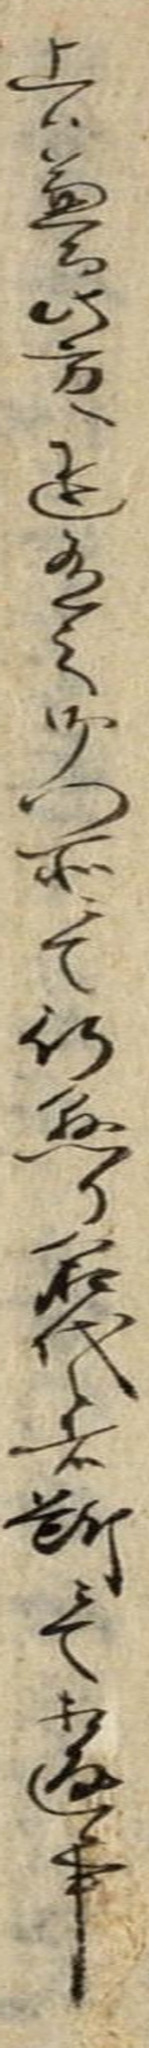上は兼て此方へ達有之御門所にて行懸り名代之者断にて相通候事
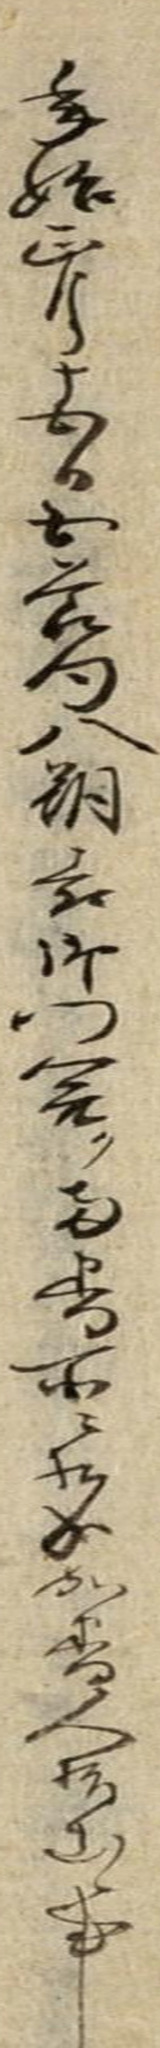一年始正月十五日五節句八朔表御門開く両番所に相成加番人指出候事
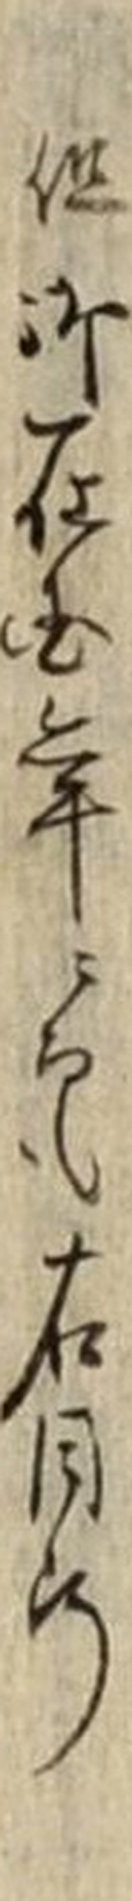但御在国年にても右同断
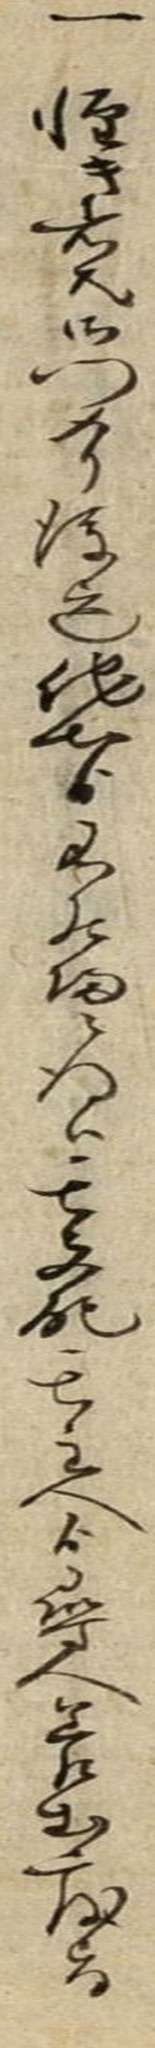一軽き者共御門〆り後迄他出ゟ不罷帰候得は其支配其主人ゟ尋人差出度旨
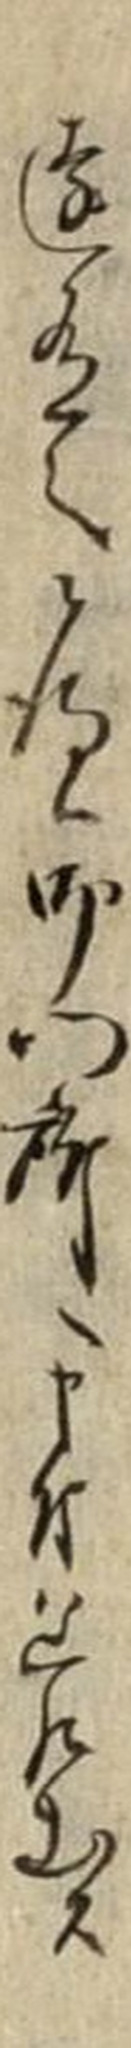達有之候得は御門所へ申付差出す
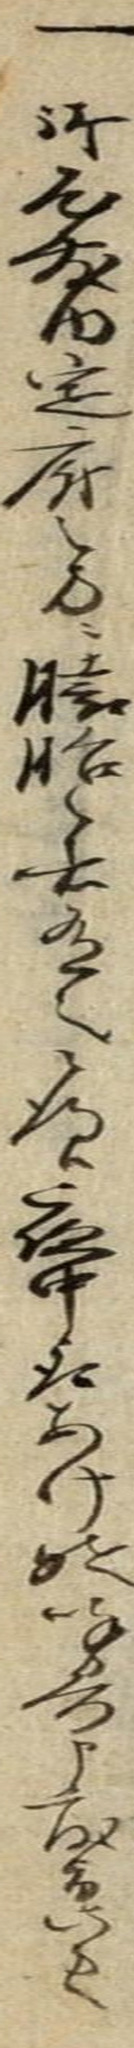一御屋敷内定府之方に懐胎之者有之候得は夜中取あけ姥呼寄申度旨此方へ
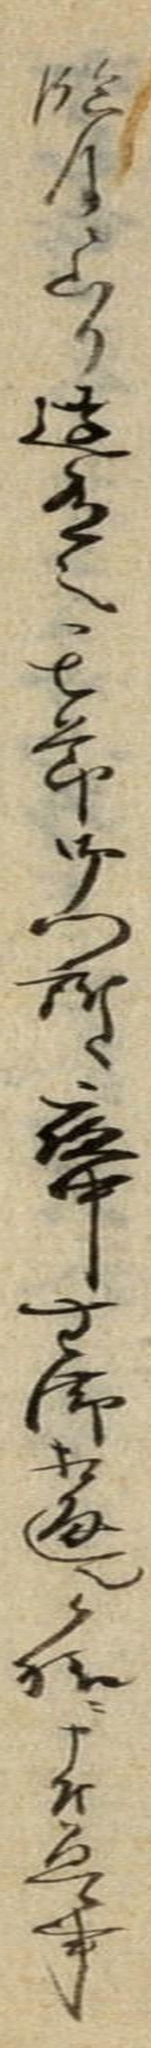臨月に至り達有之其節御門所へ夜中無滞相通し候様に申付置候事
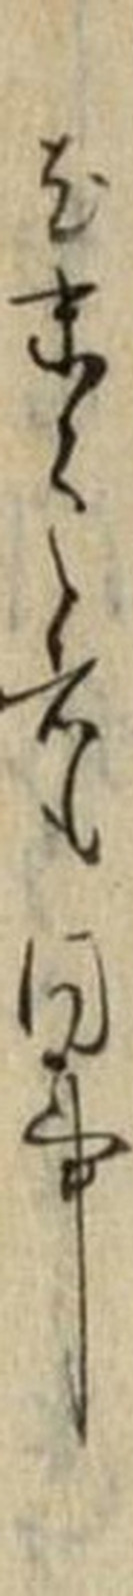尤末々之者も同事
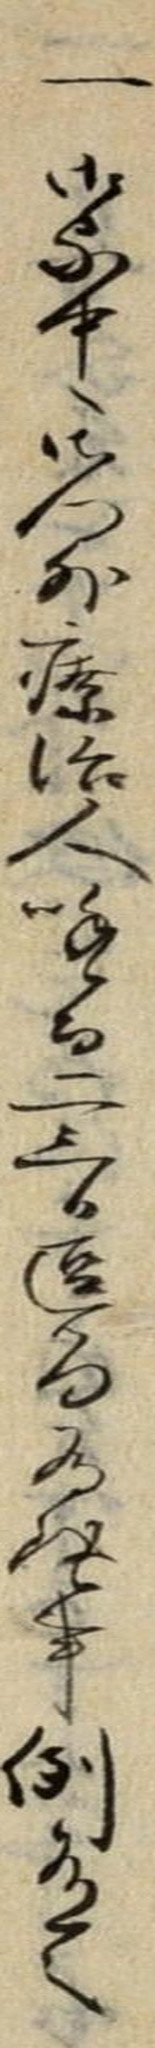一御家中へ御門外療治人呼候て二三日逗留為致候事例有之
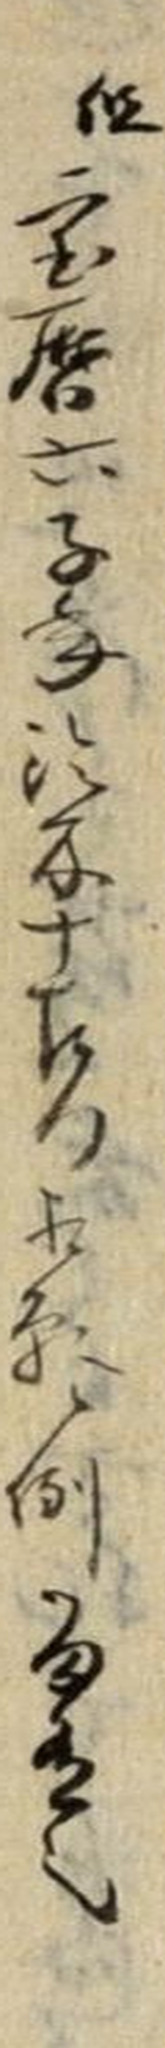但宝暦六子年鈴木十左衛門相願候例多留有之
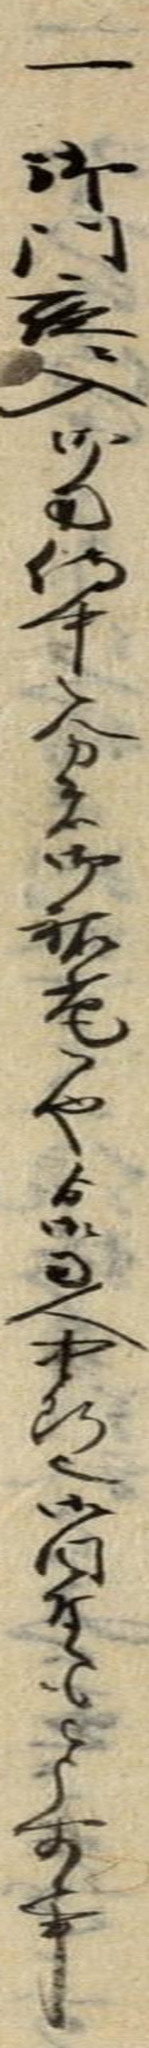一御門夜に入御用侍中之分は御祐筆へやゟ御用人中断也御目付へも被申聞候事
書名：三都并道中之部
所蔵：福井県文書館 Fukui Prefectural Archives
